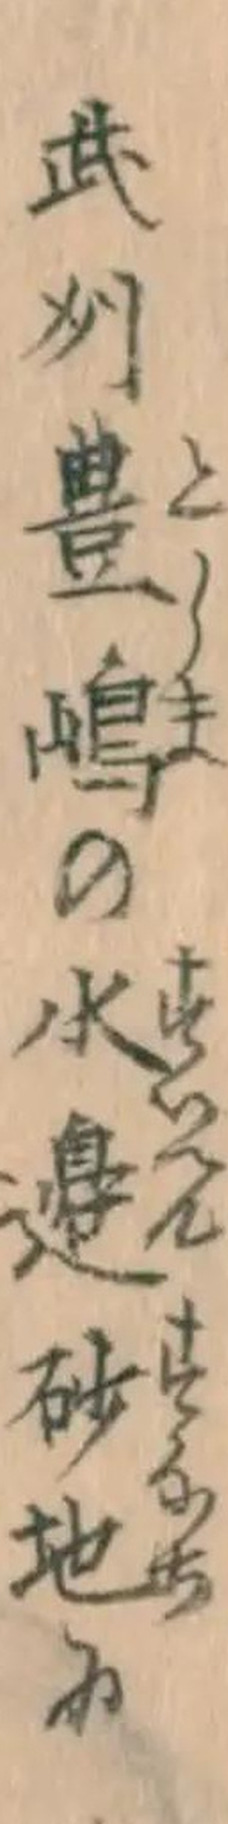武州豊嶋の水辺砂地に
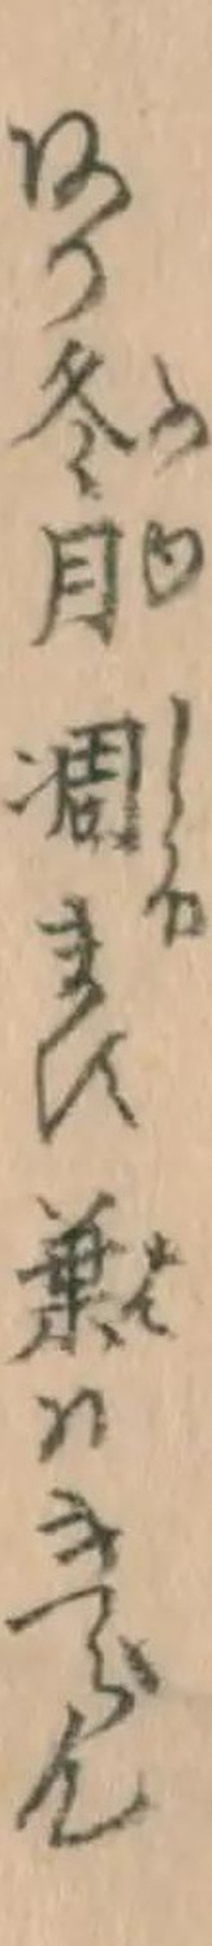あり冬月凋ます葉はきらん
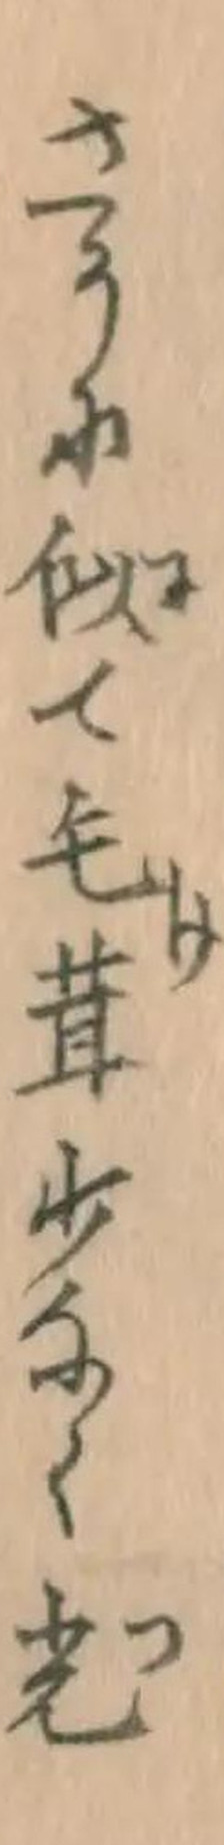さうに似て毛茸少なく光
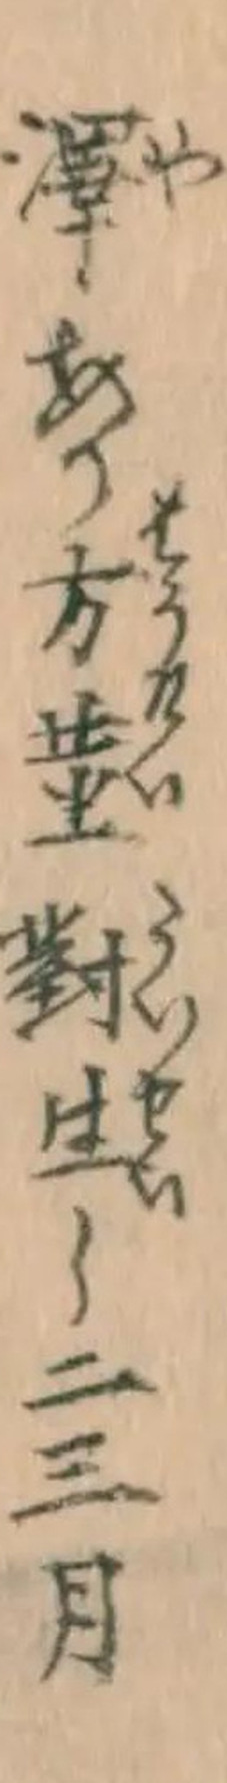沢あり方茎対生し二三月
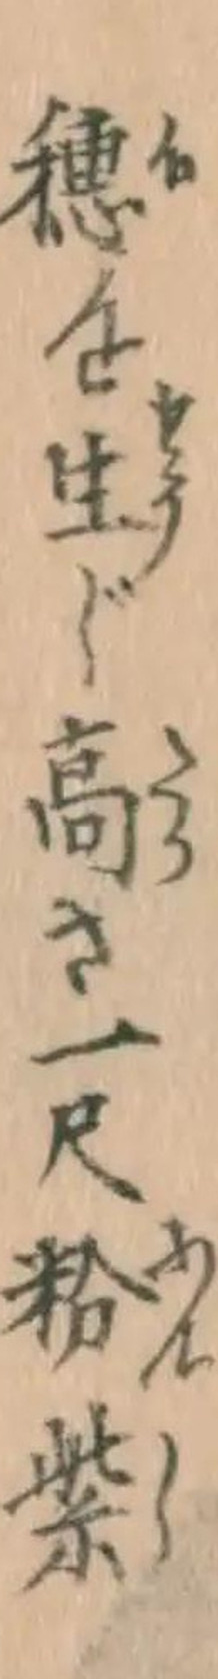穂を生じ高さ一尺粉紫
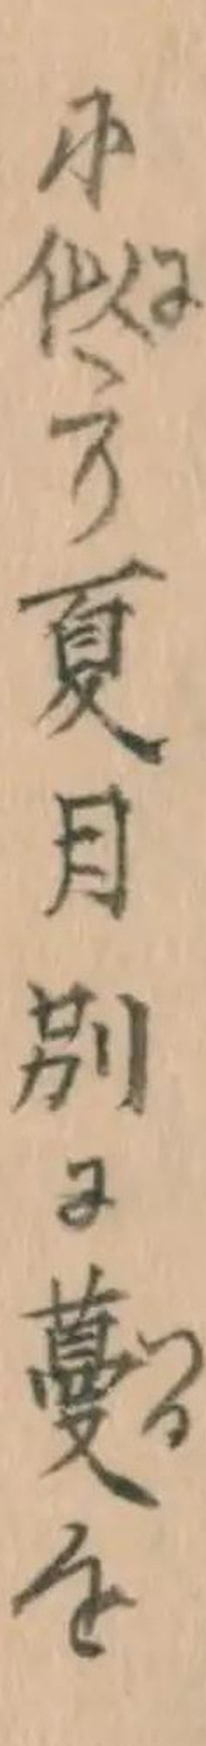に似たり夏月別に蔓を
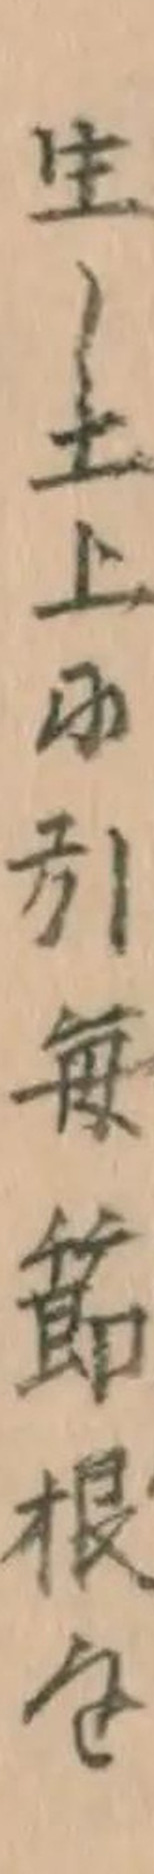生し土上に引毎節根を

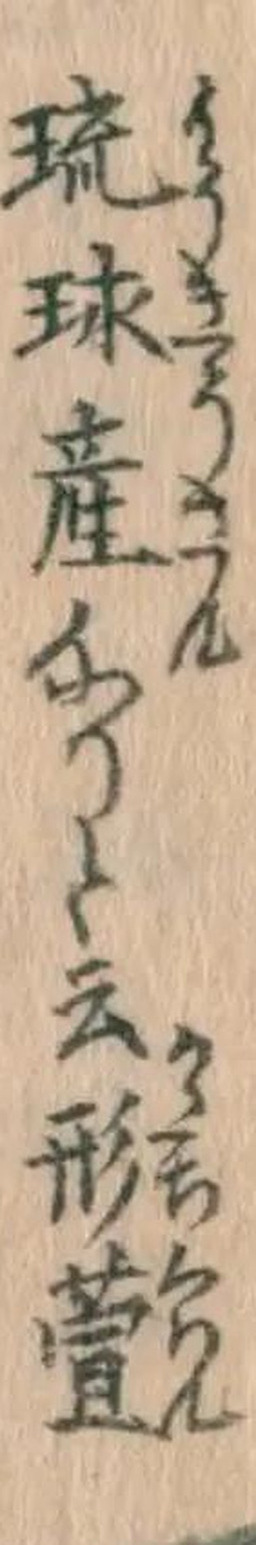琉球産なりと云形萱
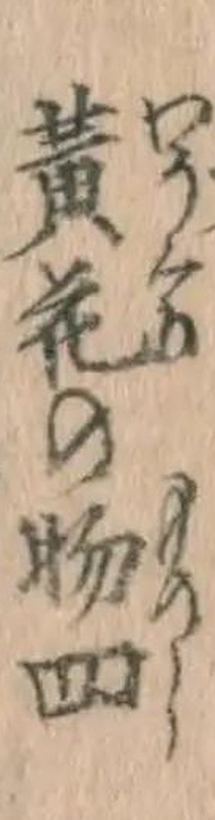黄花の物四
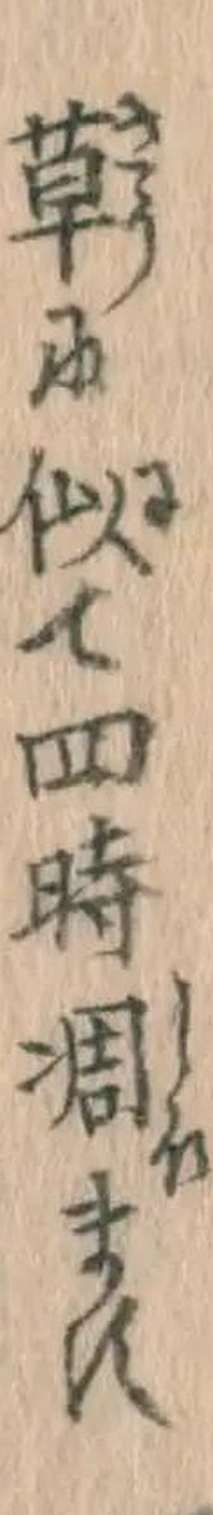草に似て四時凋ます
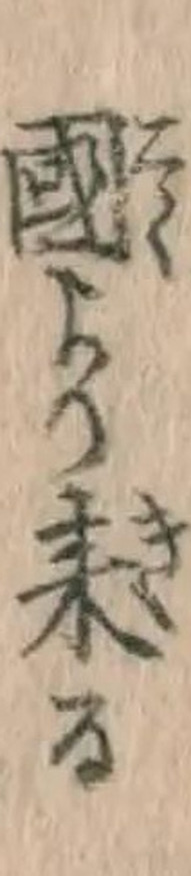国より来る
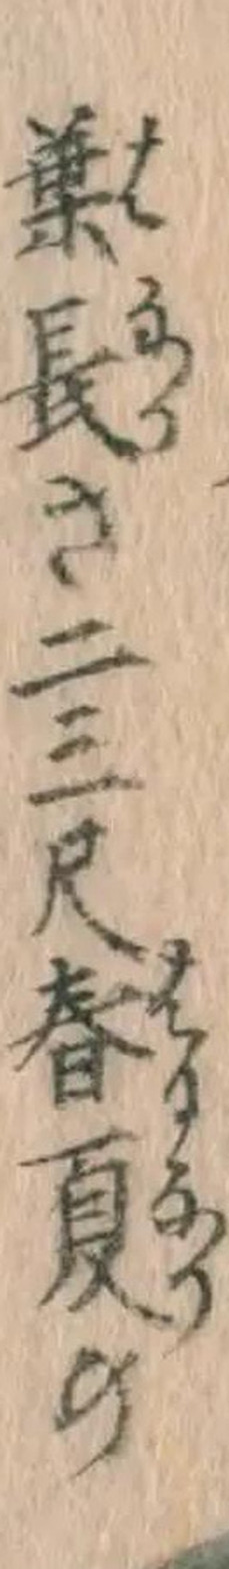葉長さ二三尺春夏の
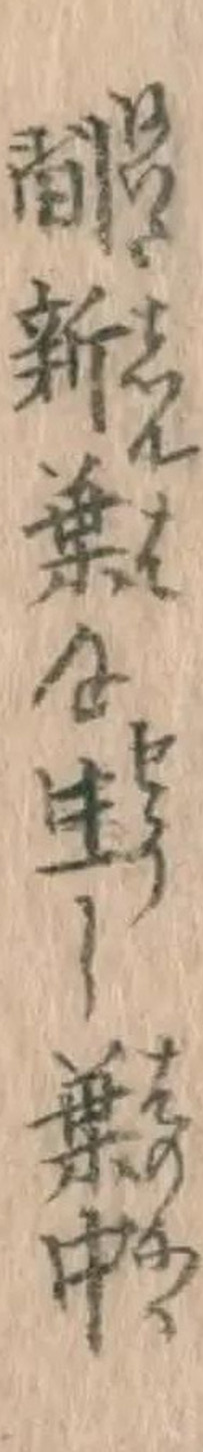間新葉を生し葉中
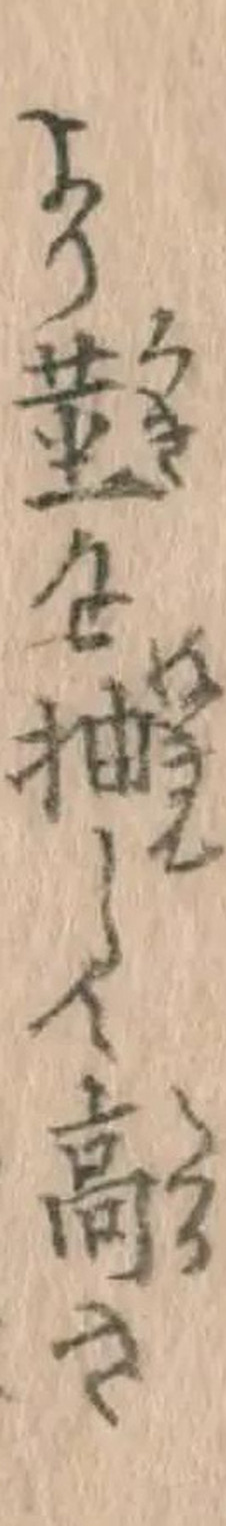より茎を抽して高さ
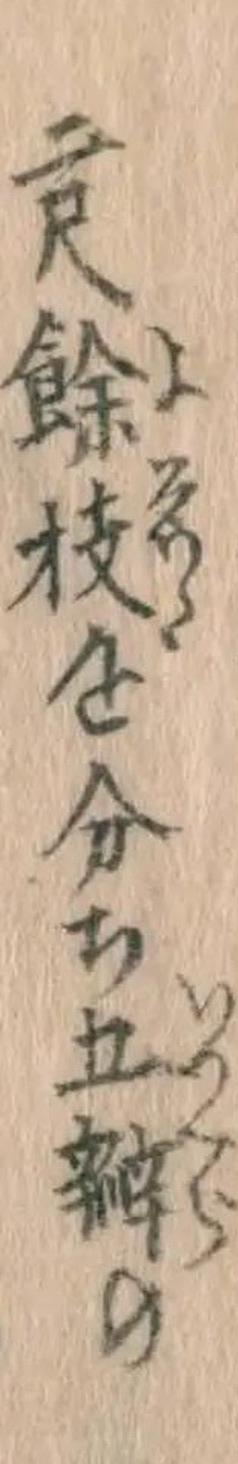二尺余枝を分ち五弁の
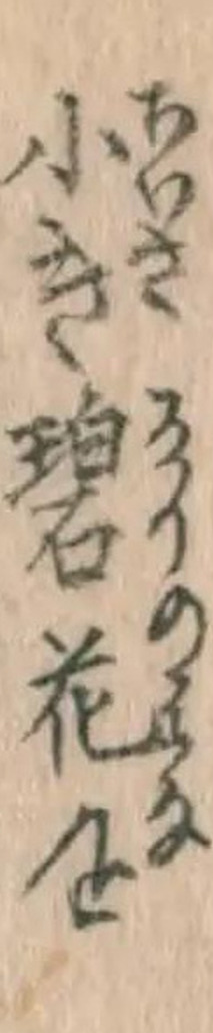小き碧花を
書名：本草図譜. 巻37-39
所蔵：国立国会図書館 National Diet Library, JAPAN
